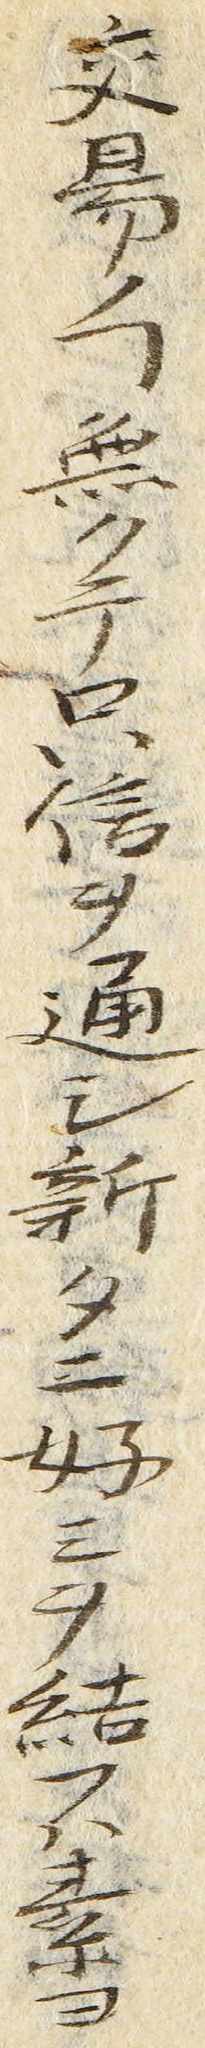交易ノヿ無クテ只信ヲ通シ新タニ好ミヲ結フハ素ヨ
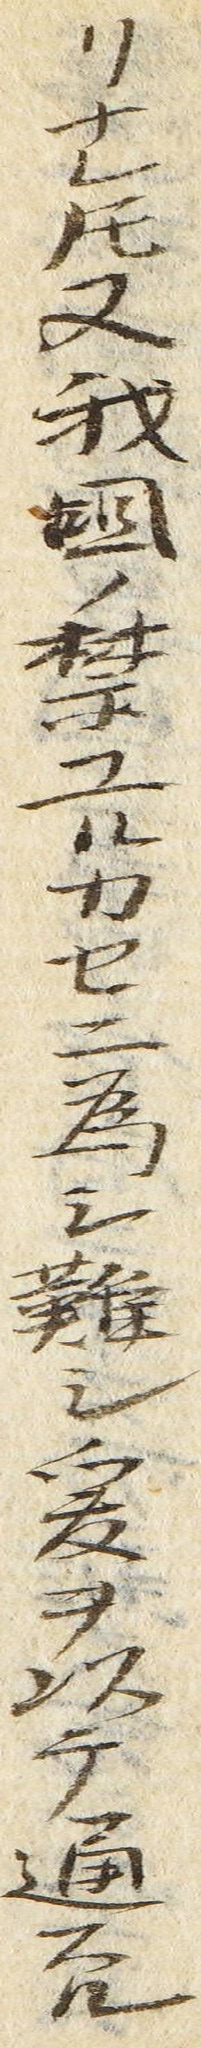リナレトモ又我国ノ禁ユルカセニ為シ難シ爰ヲ以テ通スル
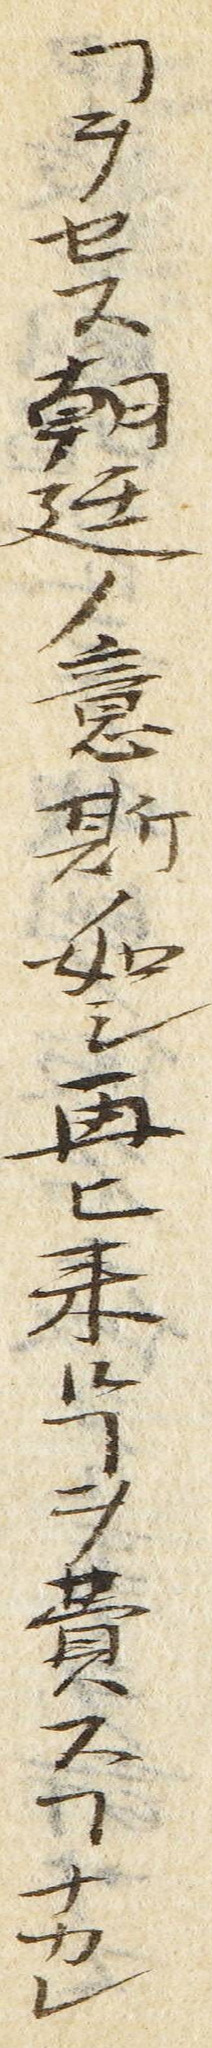ヿヲセス朝廷ノ意斯ノ如シ再ヒ来ルヿヲ費スヿナカレ
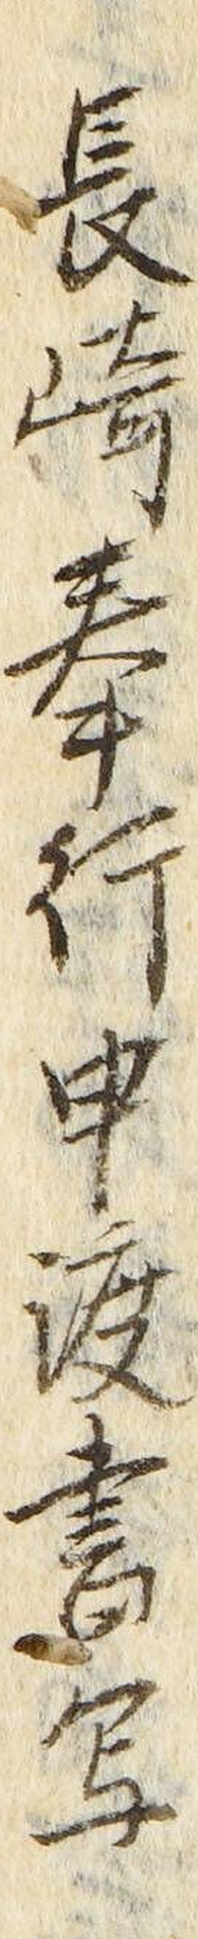長崎奉行申渡書写

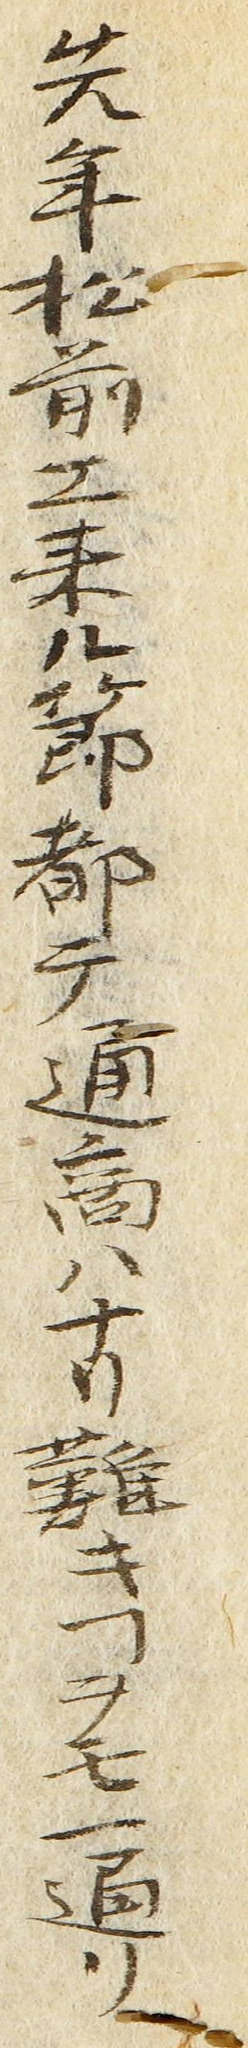先年松前エ来ル節都テ通商ハナリ難キヿヲモ一通リ
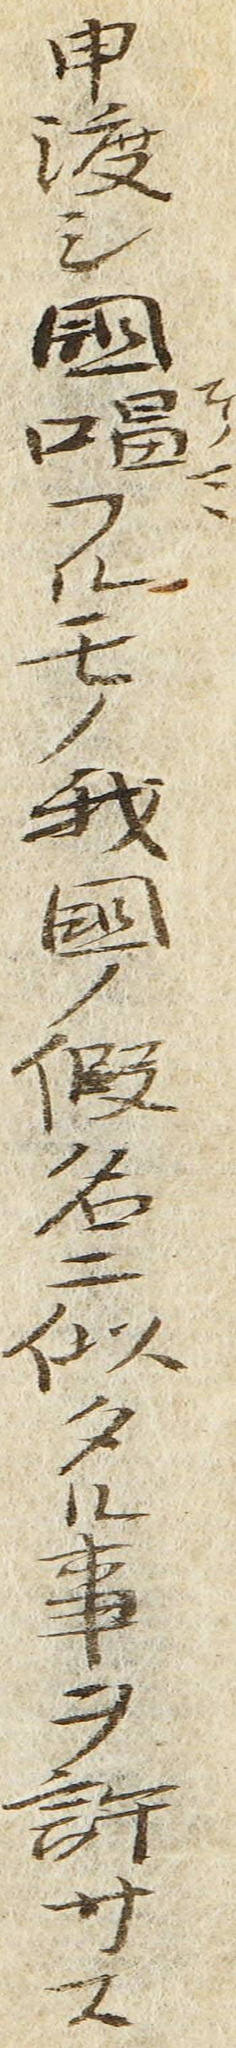申渡シ国唱フルモノ我国ノ仮名ニ似タル事ヲ許サス
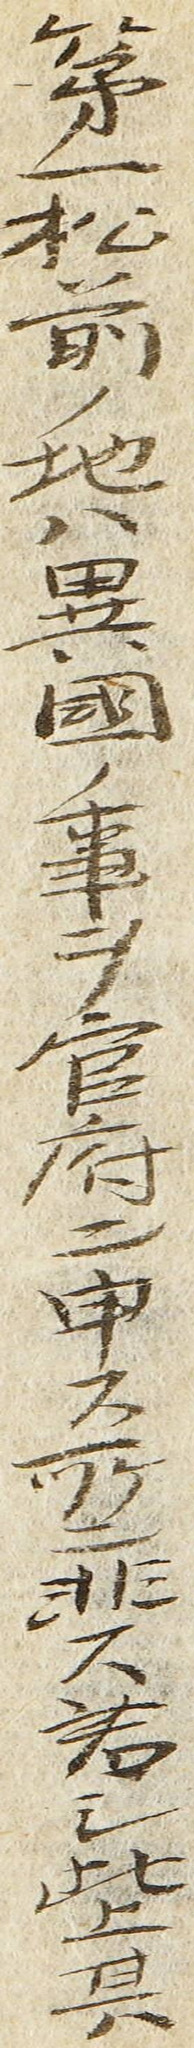第一松前ノ地ハ異国ノ事ヲ官府ニ申ス所ニ非ス若シ此上其
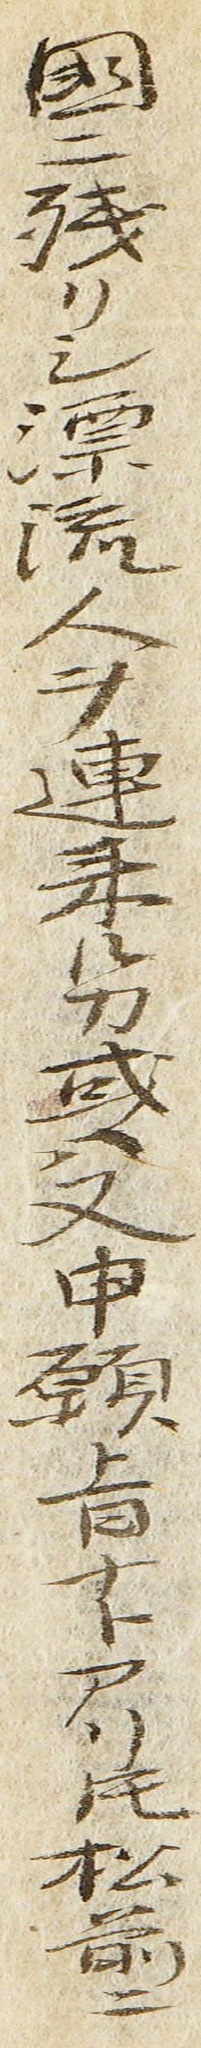国ニ残リシ漂流人ヲ連来ルカ或ハ又申願旨ナトアリトモ松前ニ
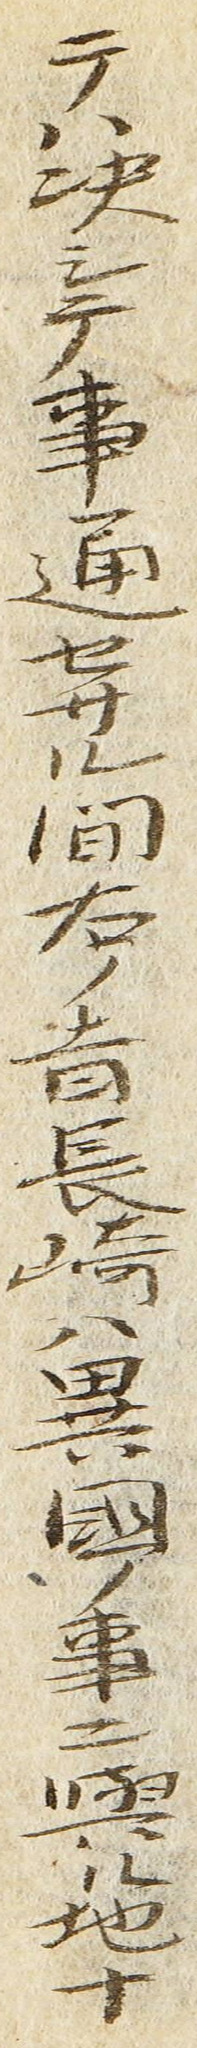テハ決シテ事通セサル間右ノ旨長崎ハ異国ノ事ニ與ル地ナ
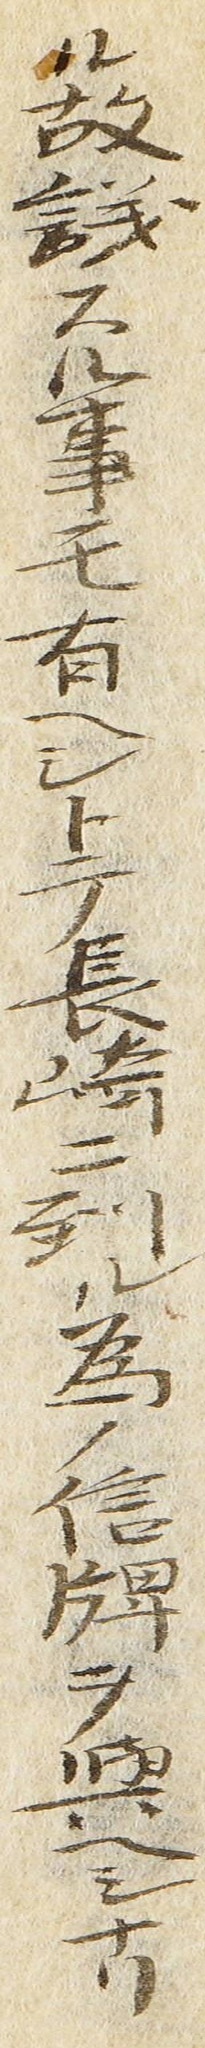ル故議スル事モ有ヘシトテ長崎ニ到ル為ノ信牌ヲ与ヘシナリ
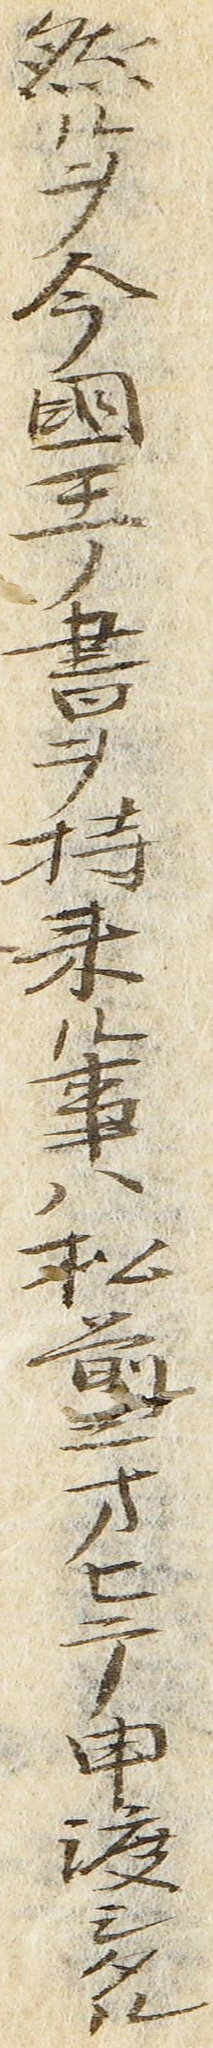然ルヲ今国王ノ書ヲ持来ル事ハ松前ニオヒテ申渡シタル
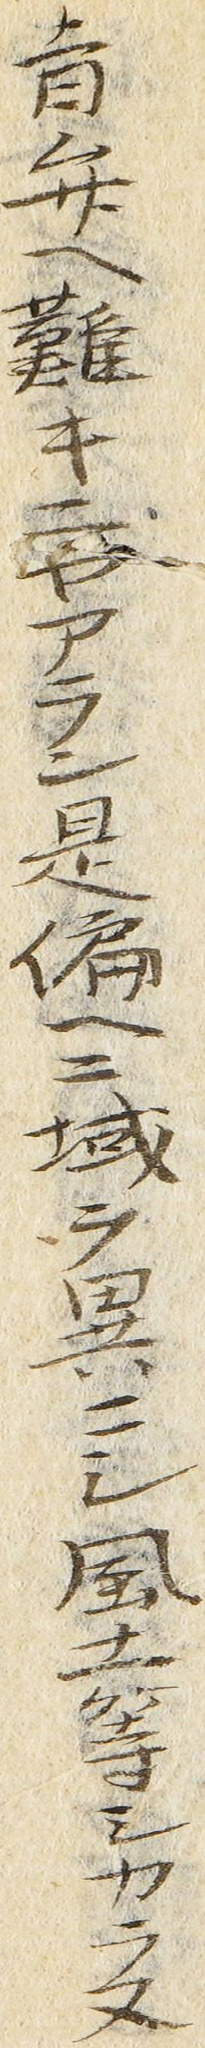旨弁ヘ難キニヤアラン是偏ヘニ域ヲ異ニシ風土等シカラヌ
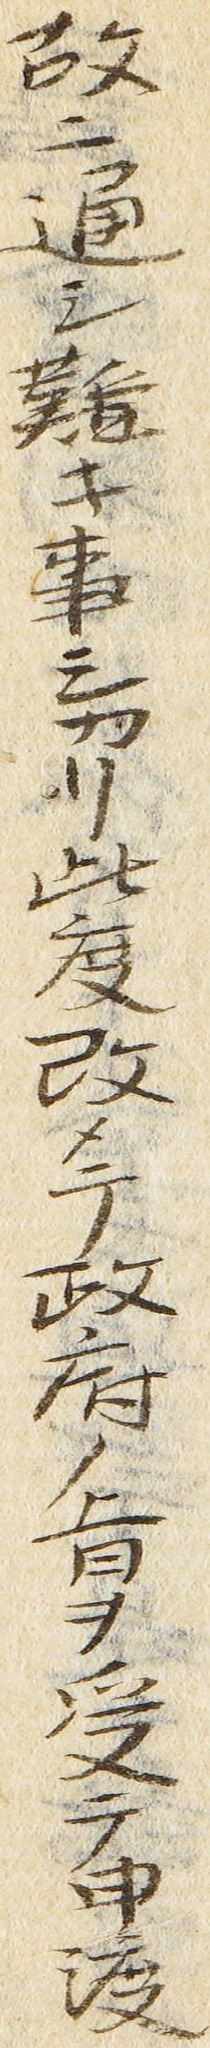故ニ通シ難キ事シカリ此度改メテ政府ノ旨ヲ受テ申渡
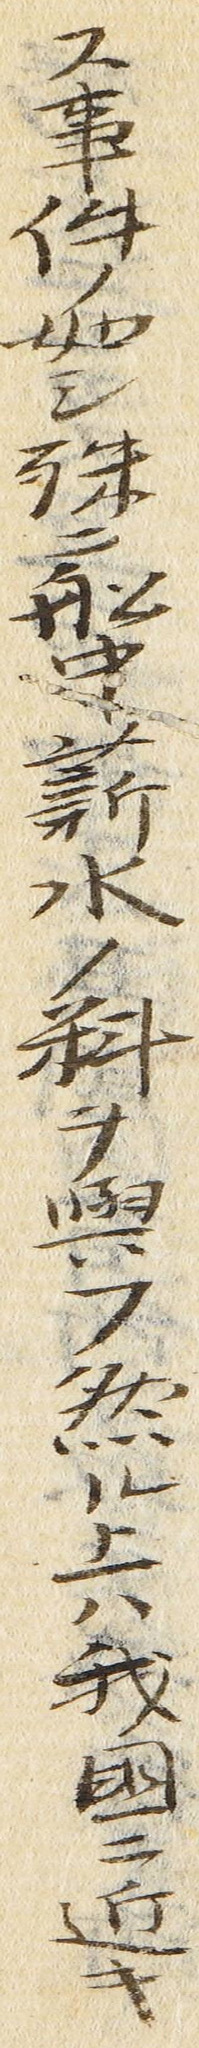ス事件ノ如シ殊ニ船中薪水ノ料ヲ与フ然ル上ハ我国ニ近キ
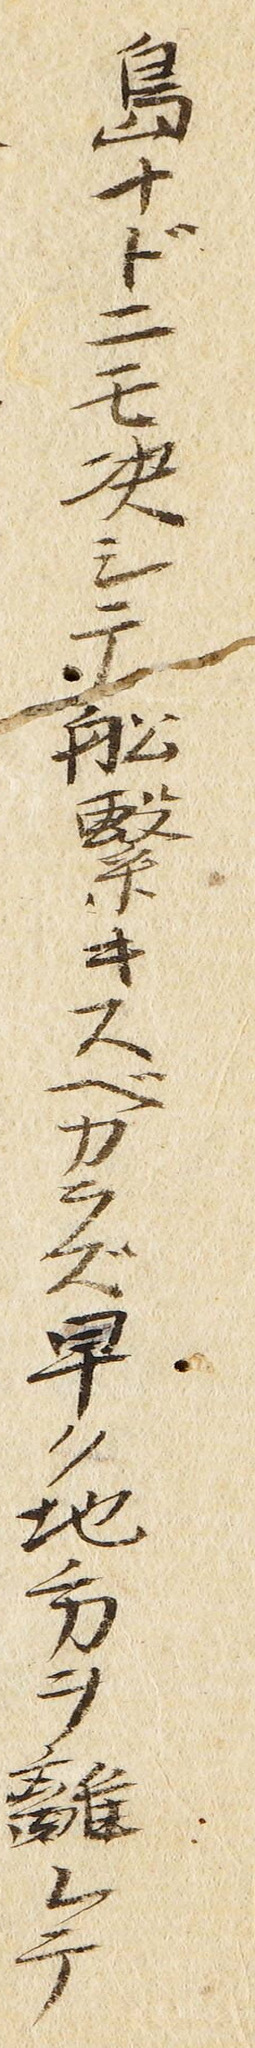島ナドニモ決シテ船繋キスベカラズ早ク地方ヲ離レテ
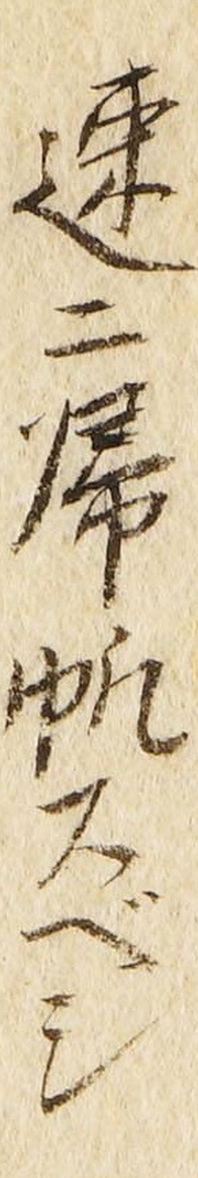速ニ帰帆スベシ
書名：漂民後記
